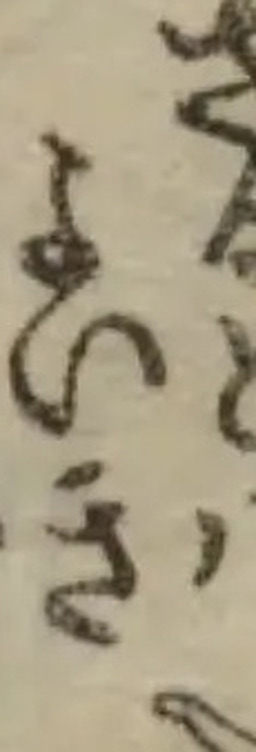よいき
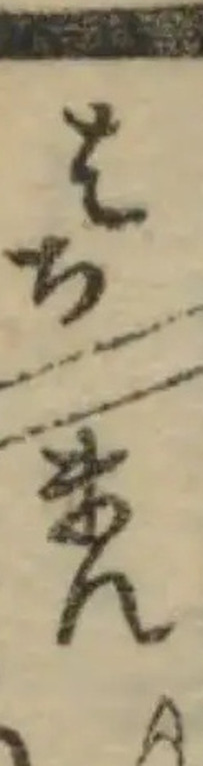はちまん
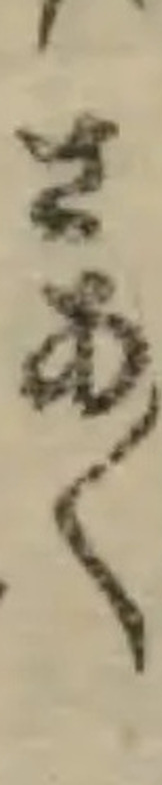さあ〳〵
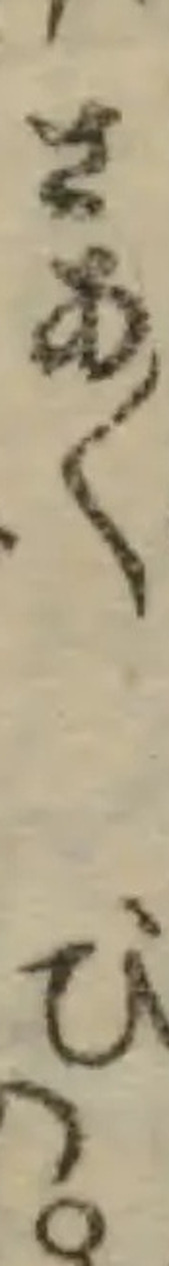さあ〳〵
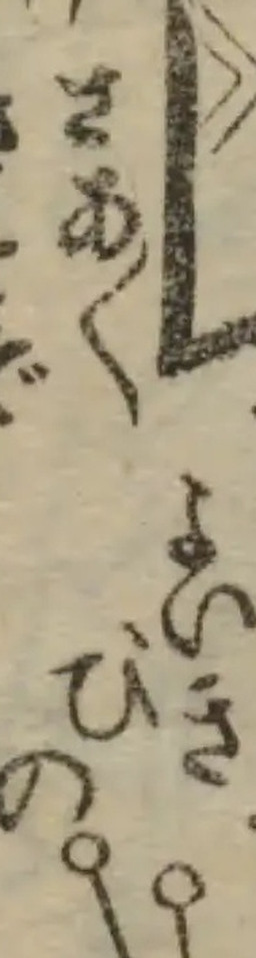さあ〳〵
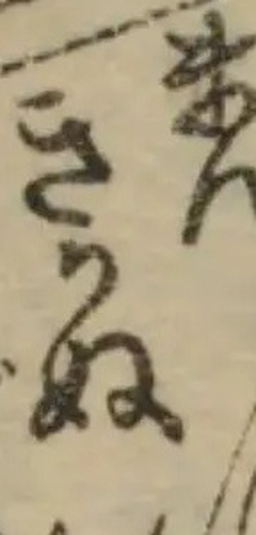きかぬ
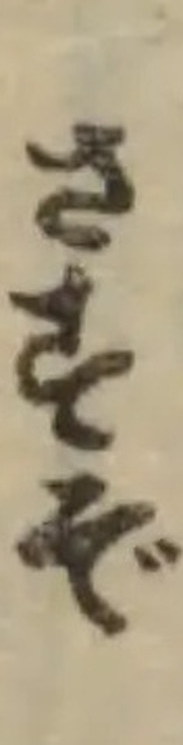さすぞ
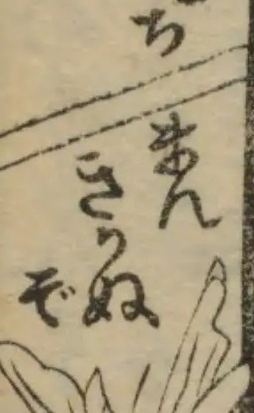きかぬ
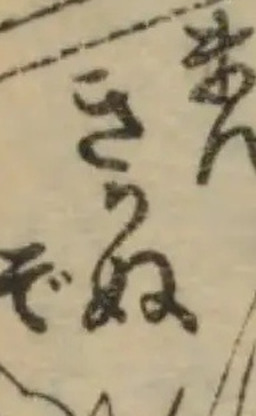きかぬ
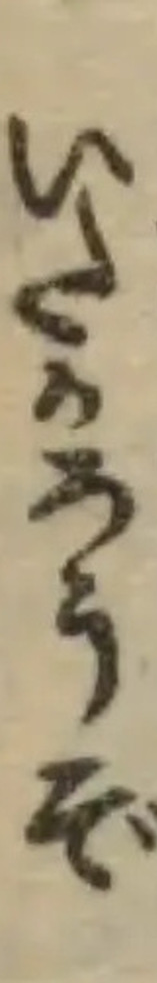いたかろうぞ
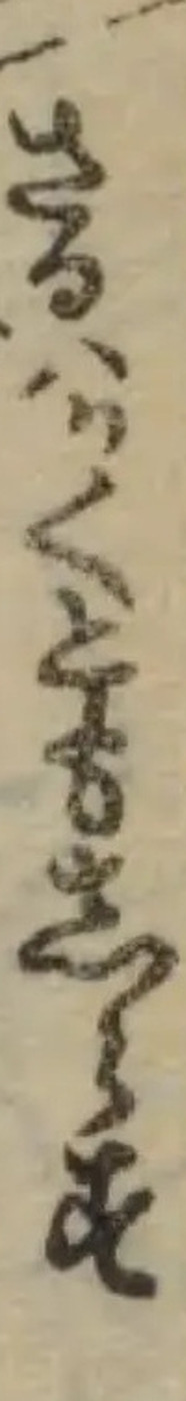さるはかくともしらす
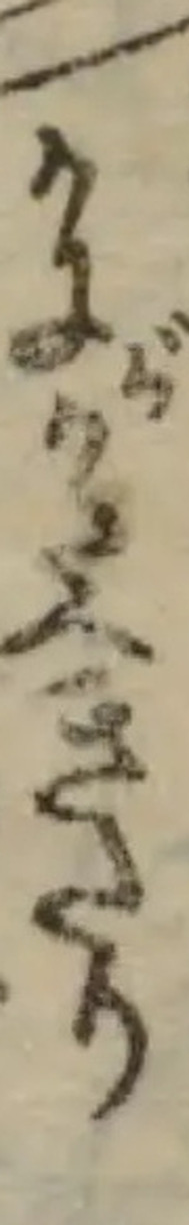かにがかたへきたり
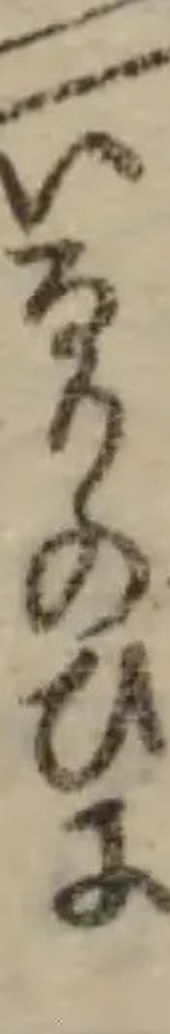いろりのひに
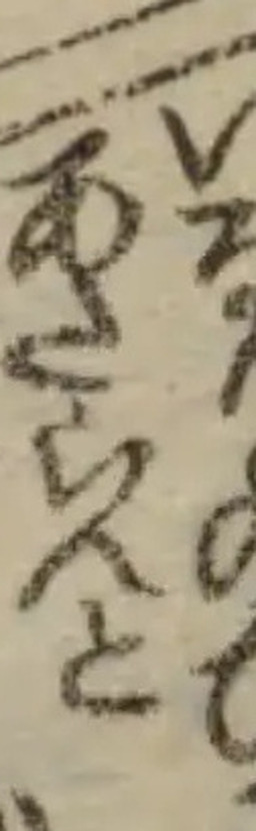あたらんと
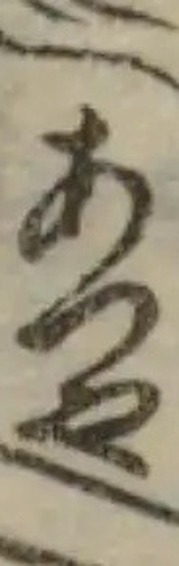あつや
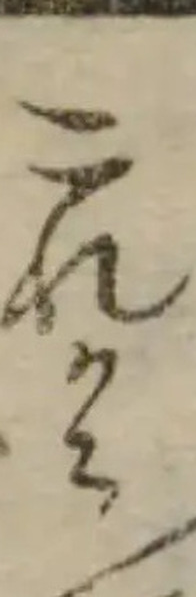これから
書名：さるかに合戦
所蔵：国立国会図書館 National Diet Library, JAPAN
